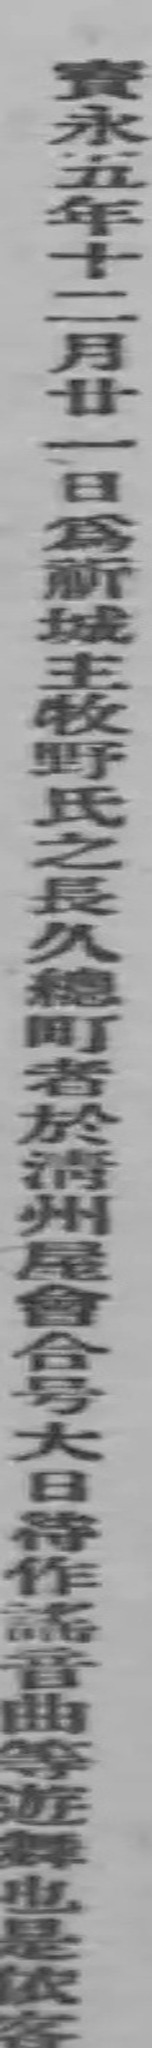宝永五年十二月廿一日為祈城主牧野氏之長久総町者於清州屋会合号大日待作謡音曲等遊舞也是依客
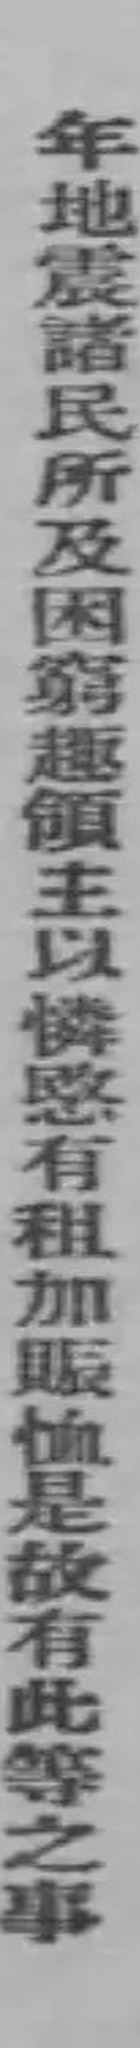年地震諸民所及困窮趣領主以憐愍有租加賑恤是故有此等之事
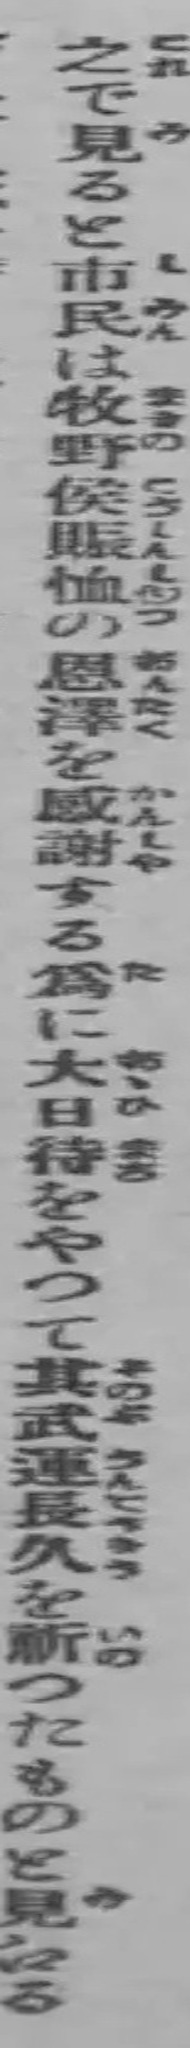之で見ると市民は牧野侯賑恤の恩沢を感謝する為に大日待をやつて其武運長久を祈つたものと見える
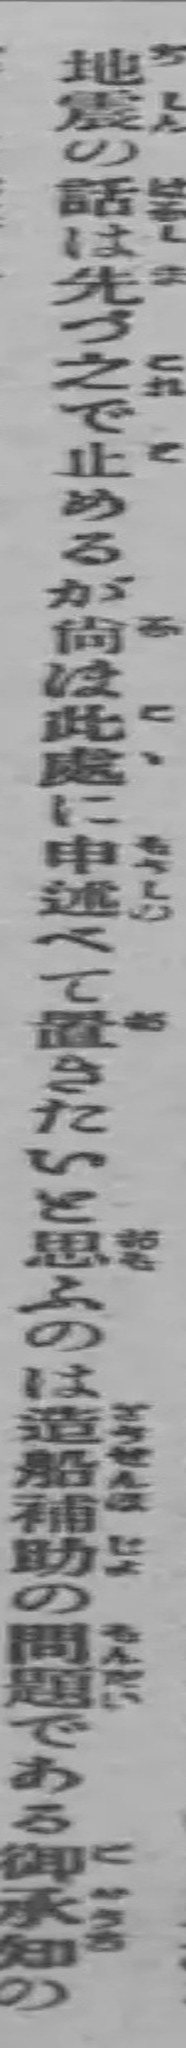造船の補助地震の話は先づ之で止めるが尚ほ此処に申述べて置きたいと思ふのは造船補助の問題である御承知の
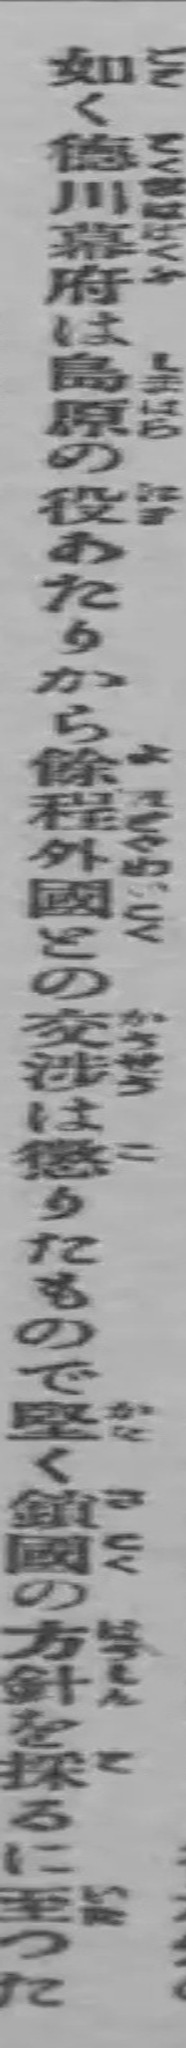如く徳川幕府は島原の役あたりから余程外国との交渉は懲りたもので堅く鎖国の方針を採るに至つた
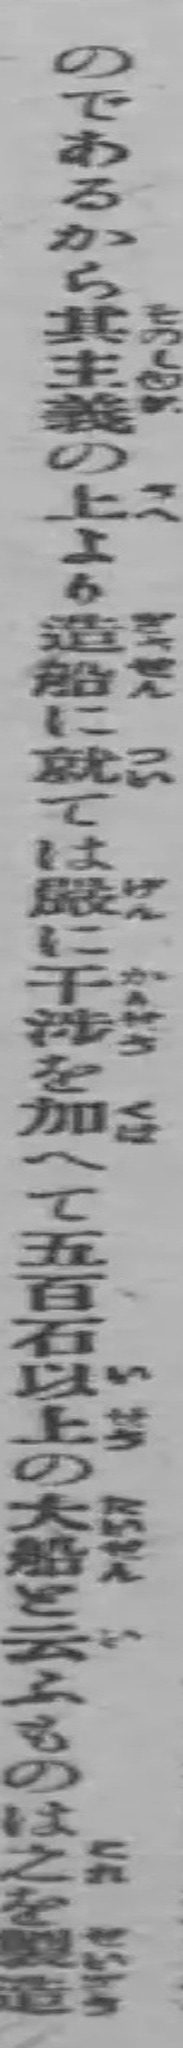のであるから其主義の上より造船に就ては厳に干渉を加へて五百石以上の大船と云ふものは之を製造
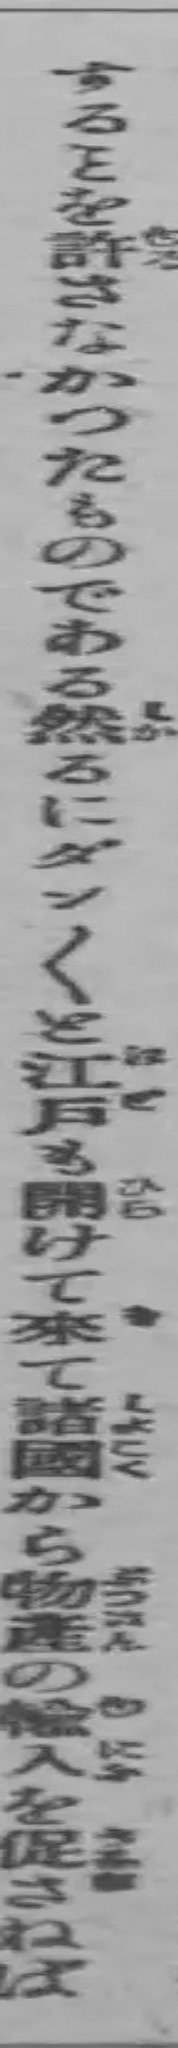することを許さなかつたものである然るにダン〳〵と江戸も開けて来て諸国から物産の輸入を促さねば
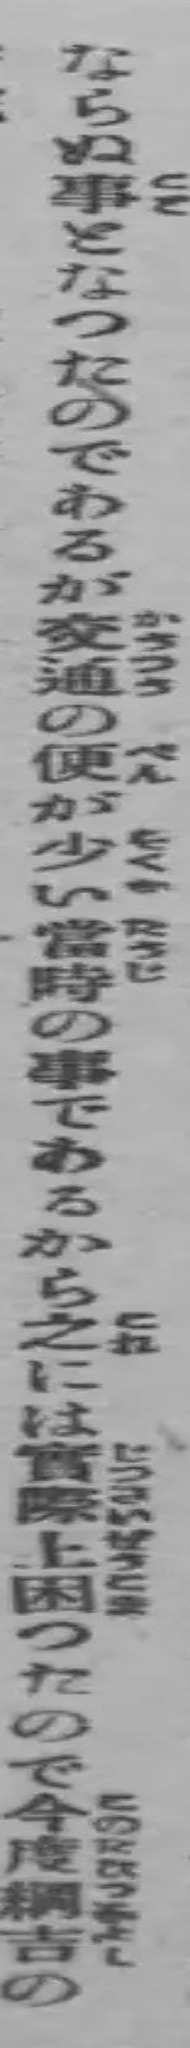ならぬ事となつたのであるが交通の便が少い当時の事であるから之には実際上困つたので今度綱吉の
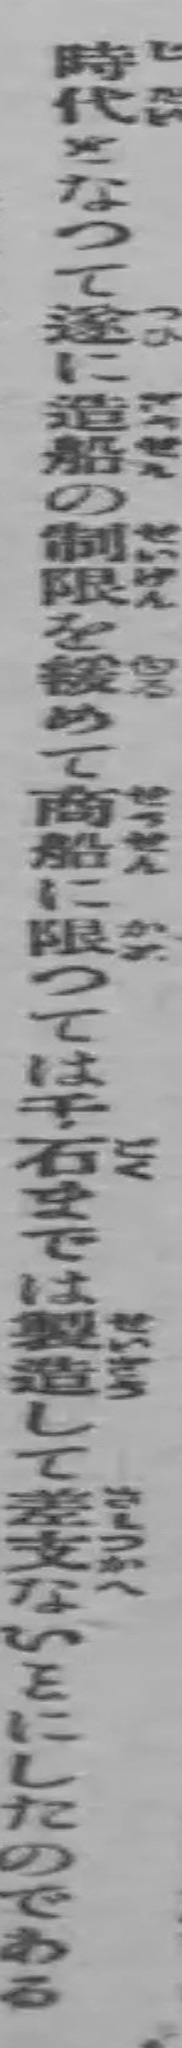時代となつて遂に造船の制限を緩めて商船に限つては千石までは製造して差支ないことにしたのである
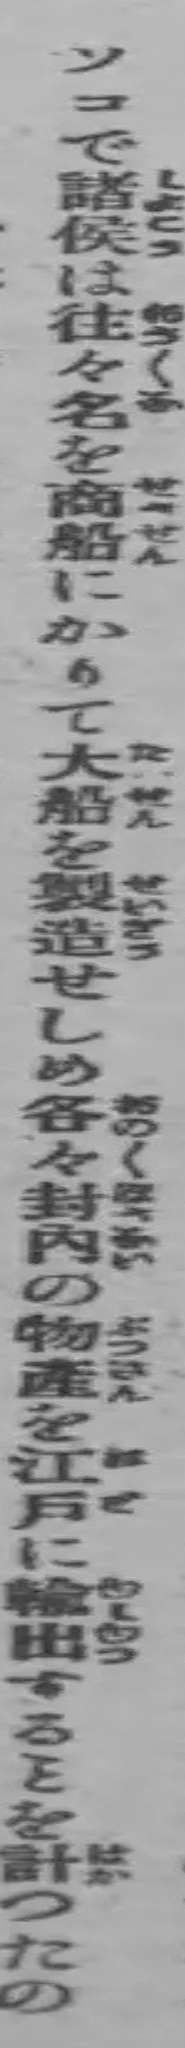ソコで諸侯は往々名を商船にかりて大船を製造せしめ各々封内の物産を江戸に輸出することを計つたの
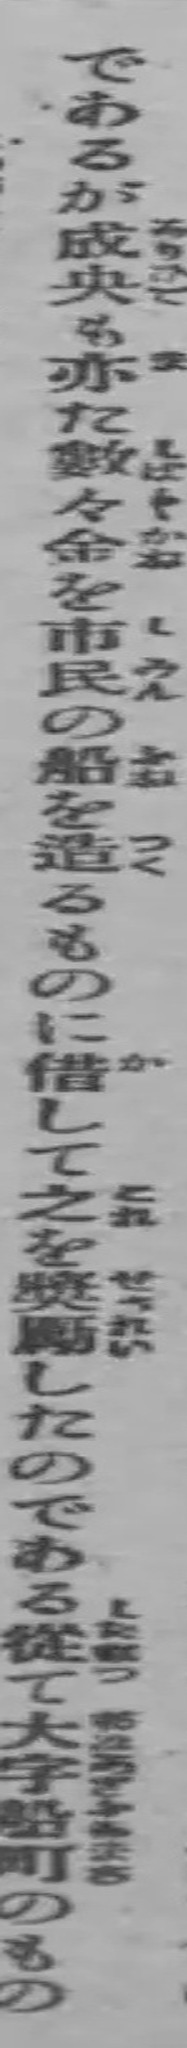であるが成央も亦た数々金を市民の船を造るものに借して之を奨励したのである従て大字船町のもの
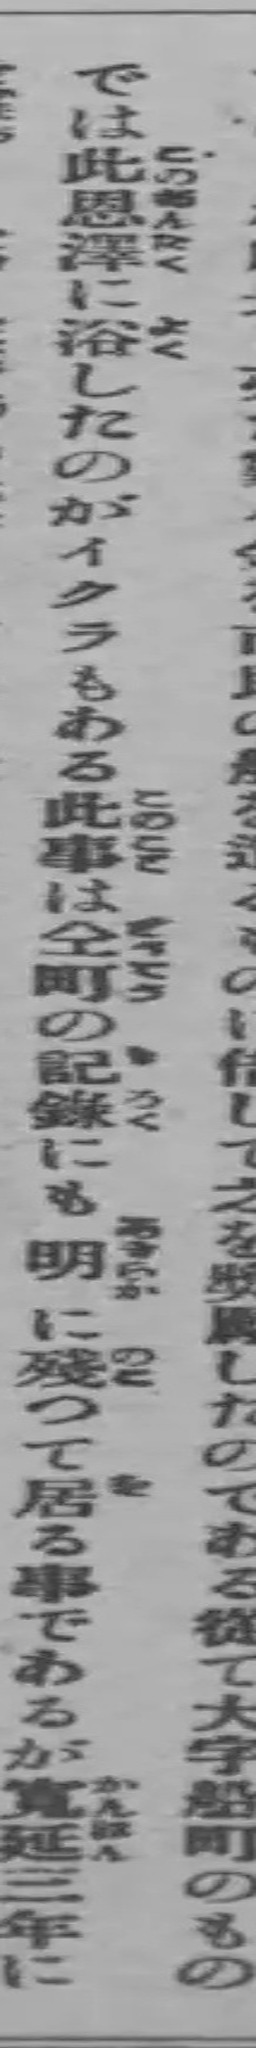では此恩沢に浴したのがイクラもある此事は仝町の記録にも明に残つて居る事であるが寛延三年に
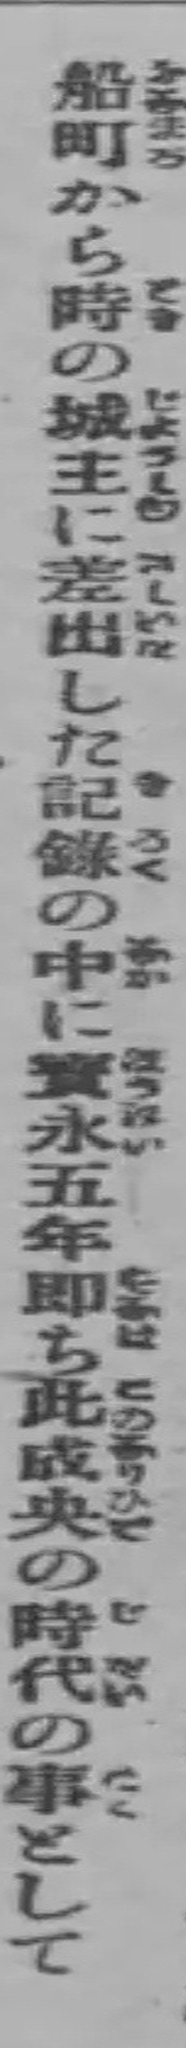船町から時の城主に差出した記録の中に宝永五年即ち此成央の時代の事として
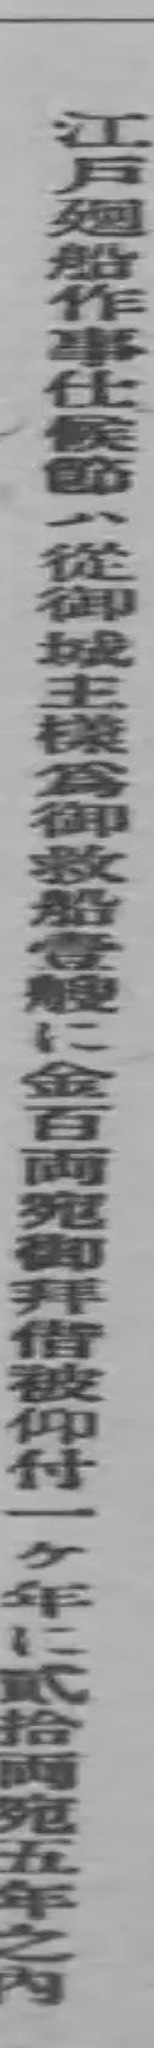江戸廻船作事仕候節ハ従御城主様為御救船壱艘に金百両宛御拝借被仰付一ケ年に弐拾両宛五年之内
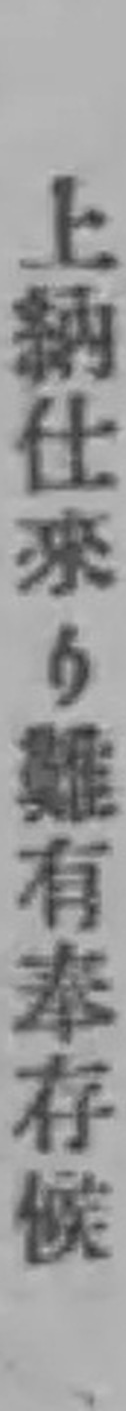上納仕来り難有奉存候
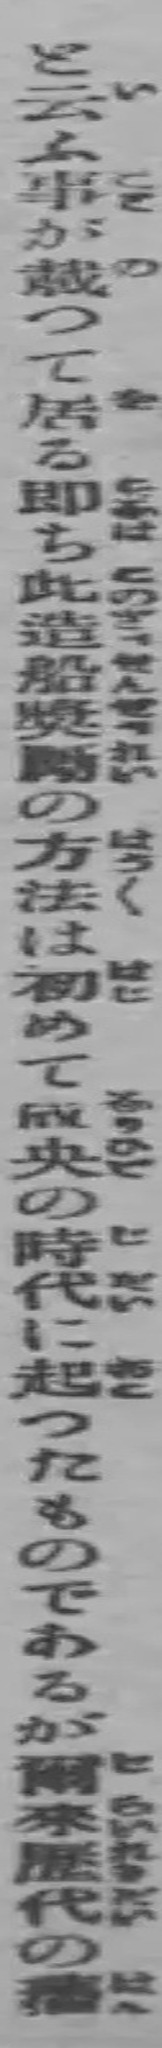と云ふ事が載つて居る即ち此造船奨励の方法は初めて成央の時代に起つたものであるが爾来歴代の藩
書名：豊橋市史談
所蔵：国立国会図書館 National Diet Library, JAPAN
